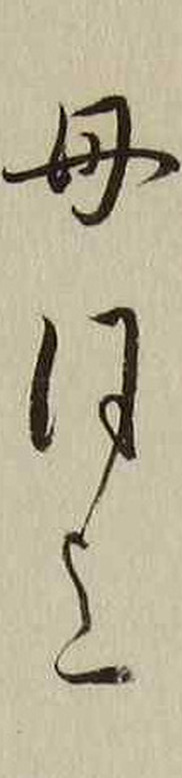母同上
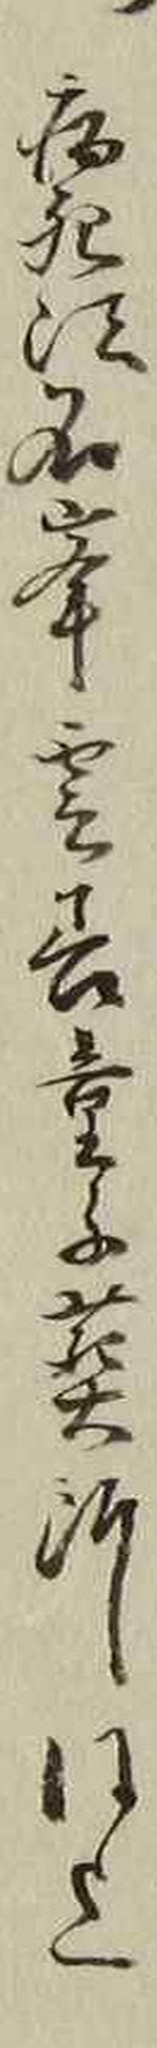病死法名峯雲善童子葬所同上
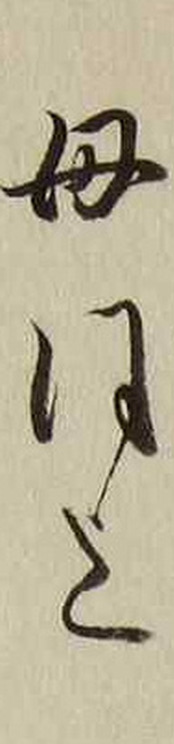母同上

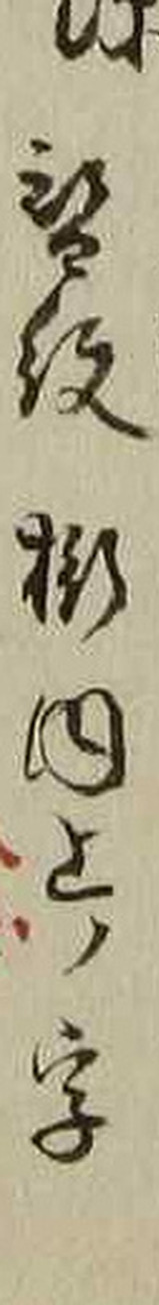又桁内上ノ字
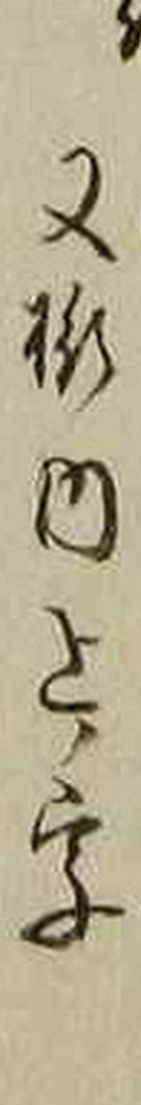又桁内上ノ字
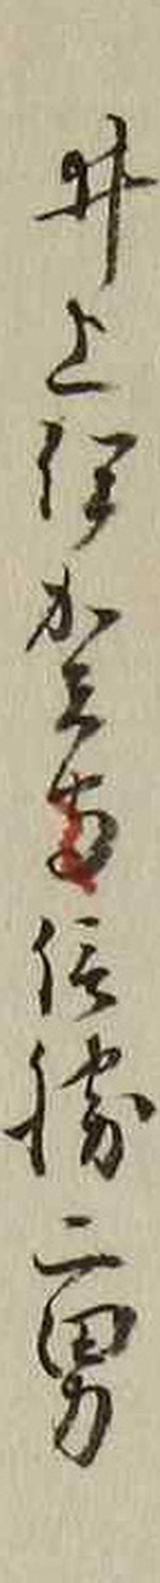井上伊賀守信勝二男
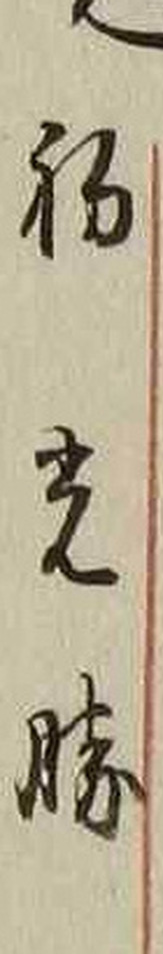初光勝
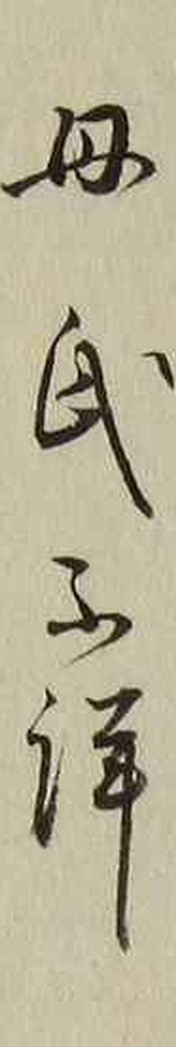母氏不詳
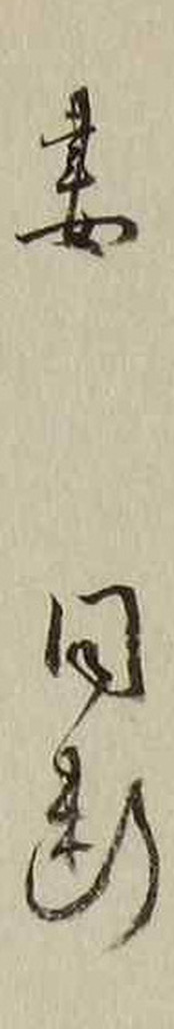妻同断
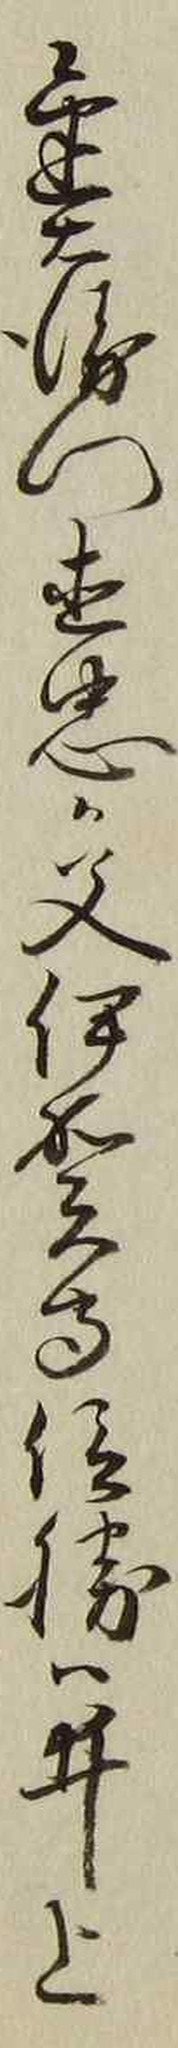金右衛門直忠か父伊賀守信勝ハ井上
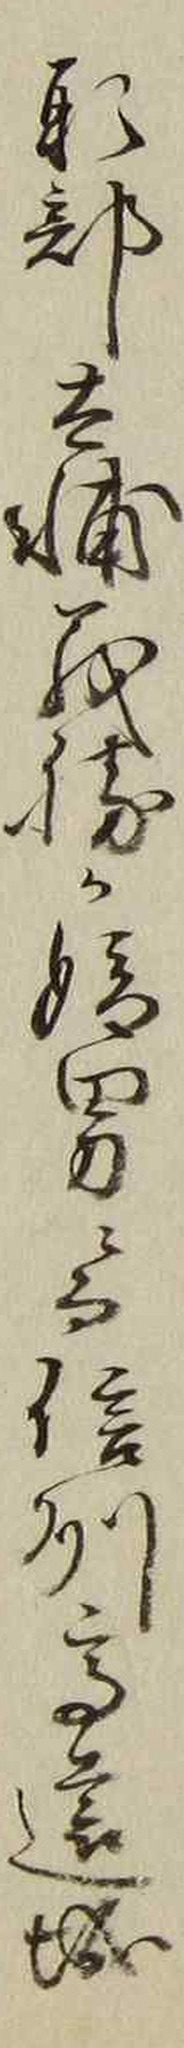形部大輔義勝か嫡男ニ而信州高遠城
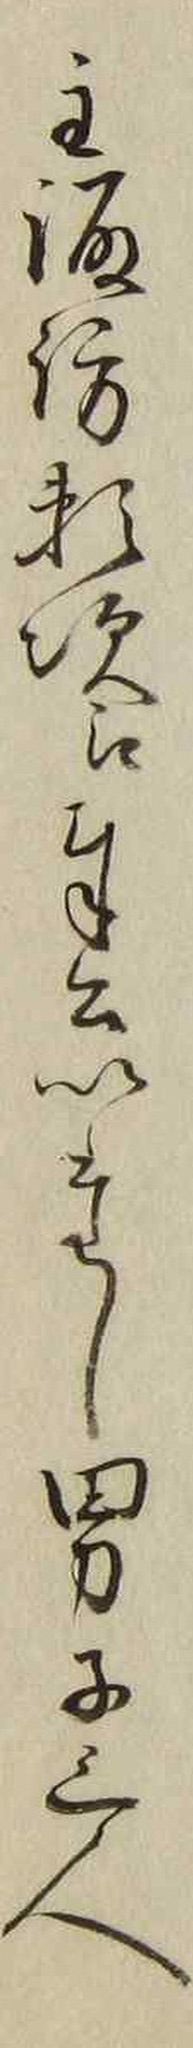主諏訪頼次江奉公いたし男子三人

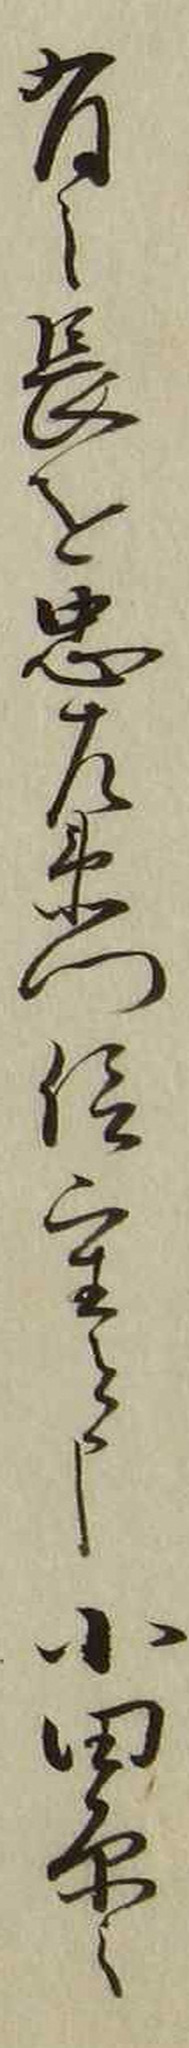有之長を忠左衛門信重と申小田原之
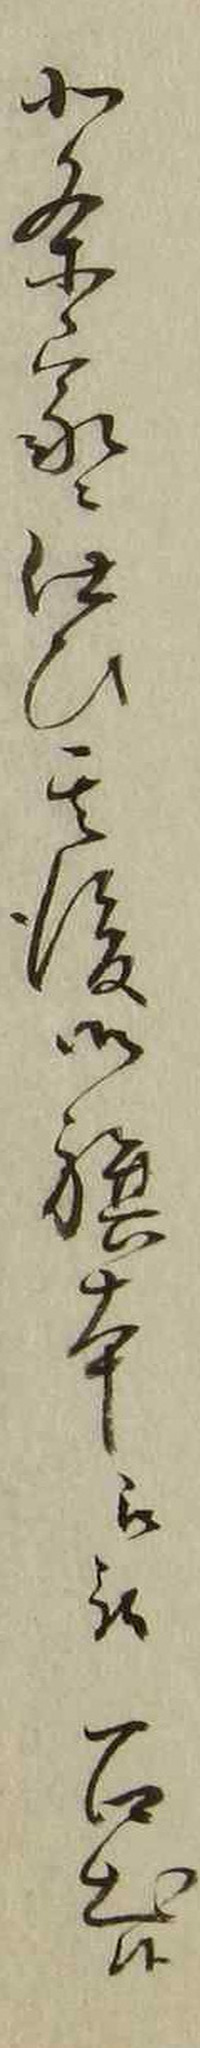北条家ニ仕ひ其後御旗本江被召出候
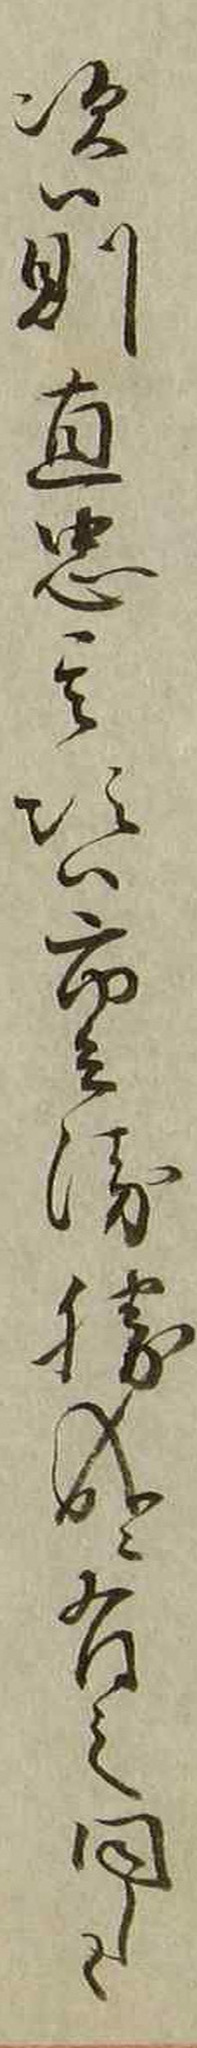次ハ則直忠其次ハ市兵衛勝成ニ有之同しく
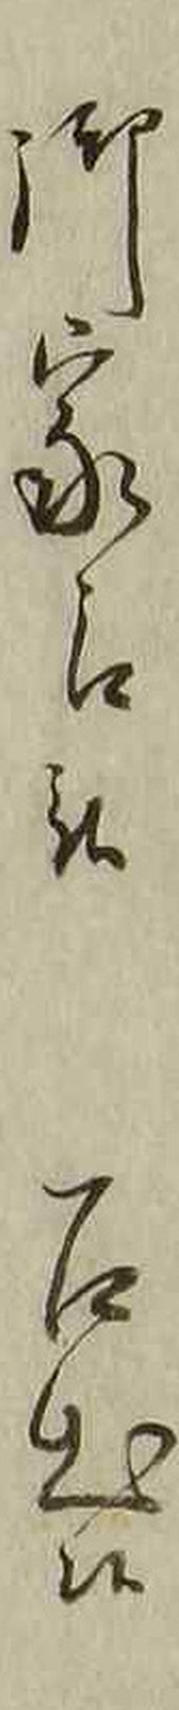御家江被召出候
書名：諸士系譜　巻之2　い之部2
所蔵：会津若松市立会津図書館
